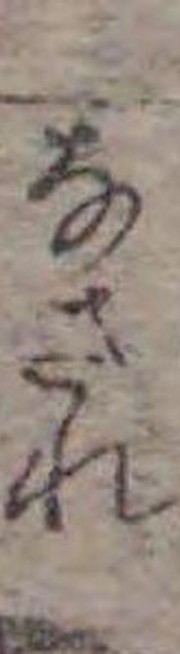なされ

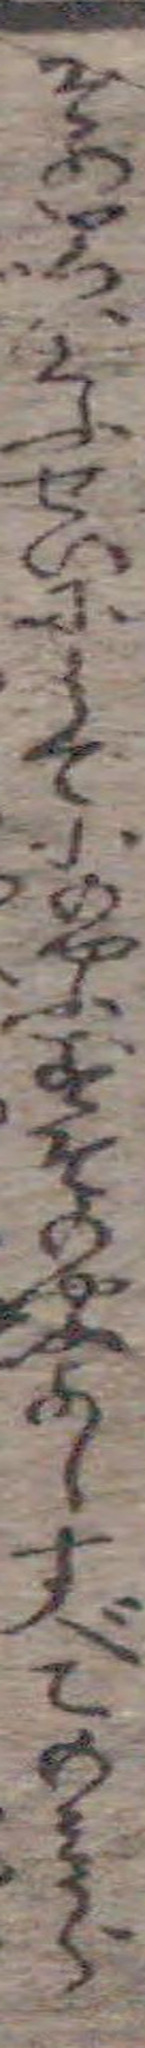そのいろはとふせいにして小もやふすそもやふよしすべてもみうら
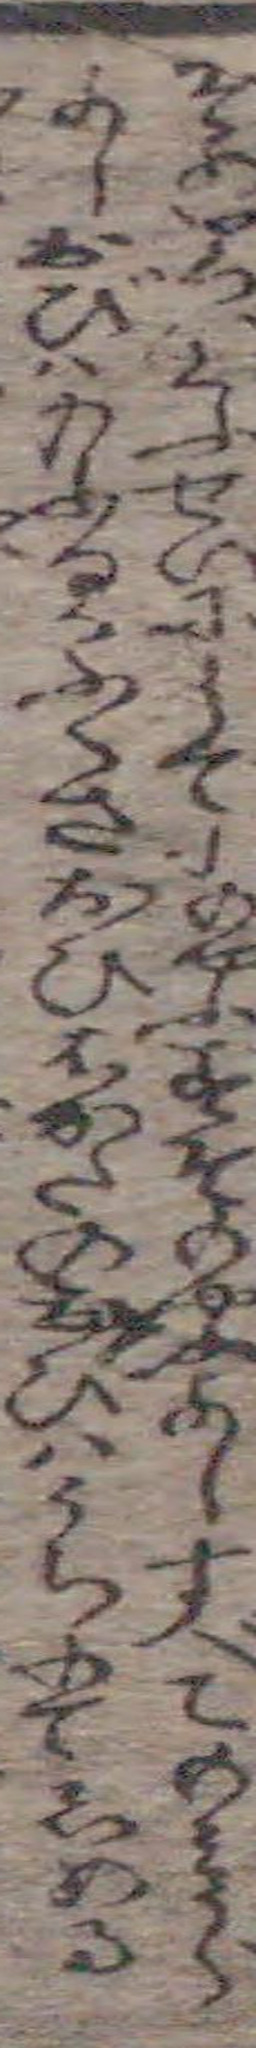よしおびはもふるかふくさおひはかたのおひはうらにてしめる
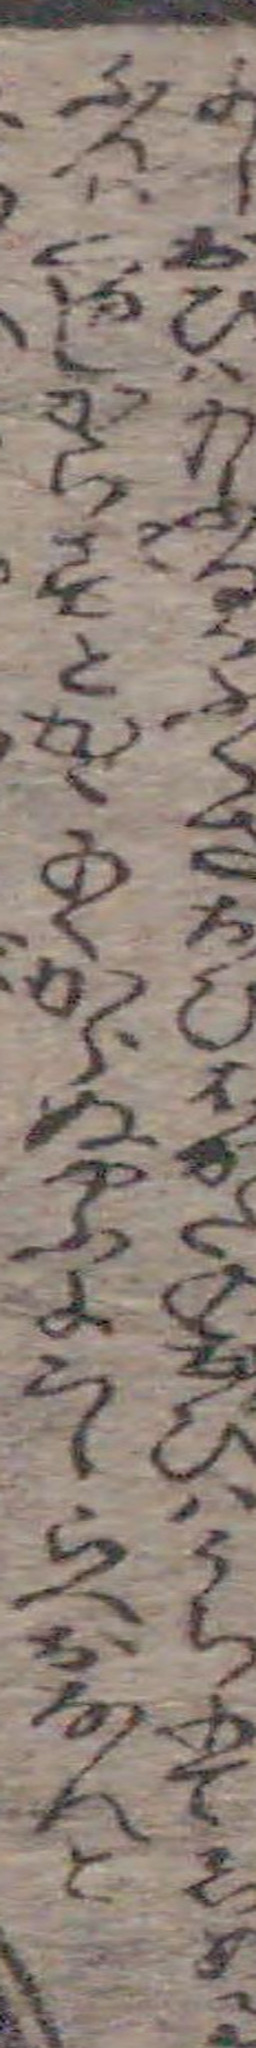ふんはくるしからすとかくにくからぬやふにこしらへおなんと
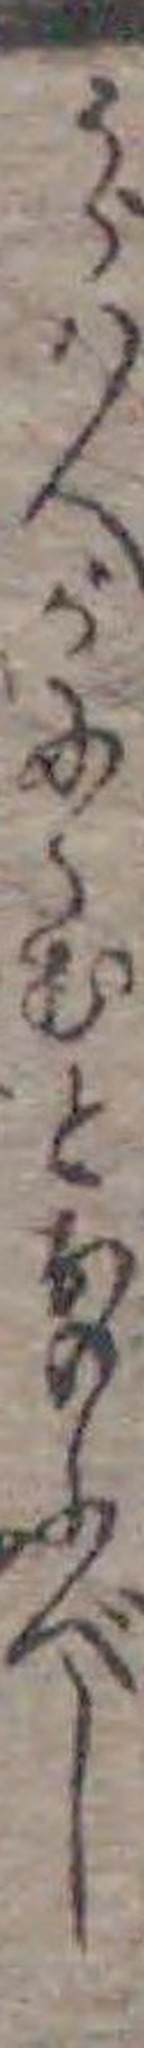うらは人かにくむとおもふべし
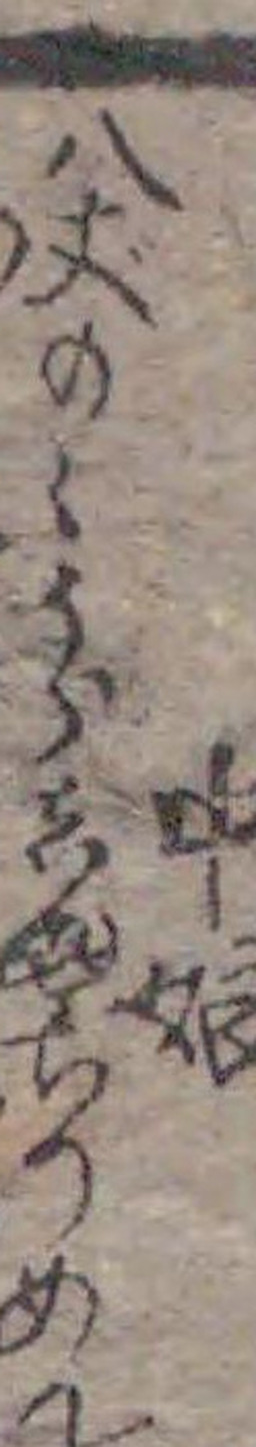八丈もみうらしまちりめん
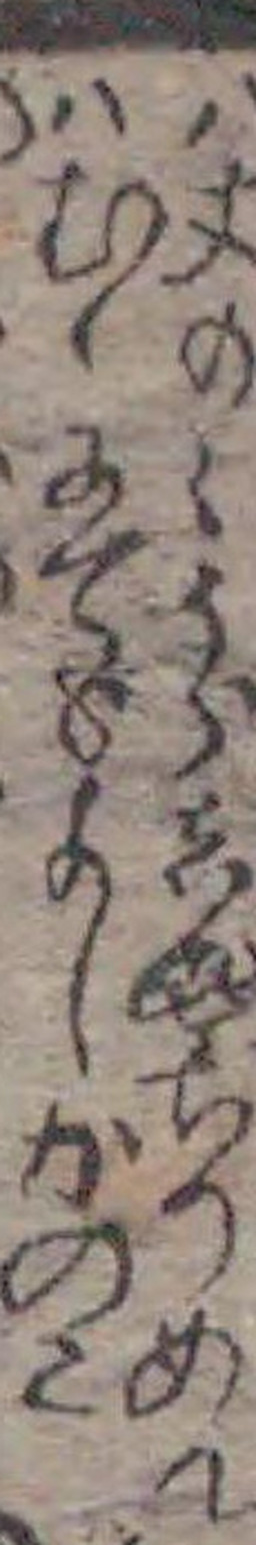はむくにてもよしかのこ
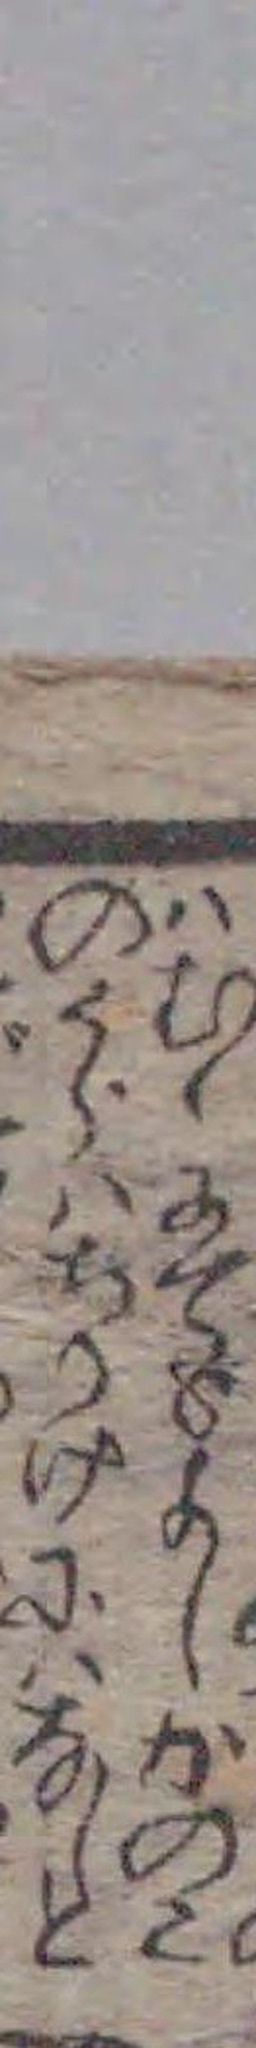のうらはちりけにはなしと
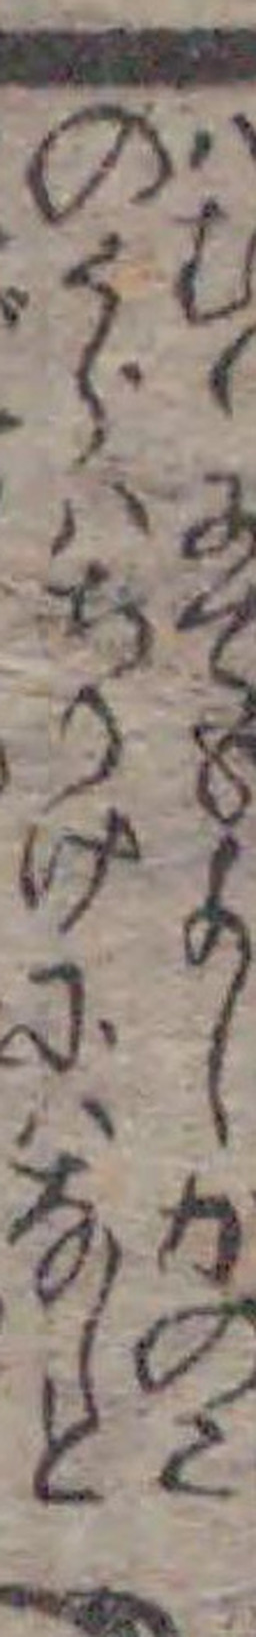のうらはちりけにはなしと
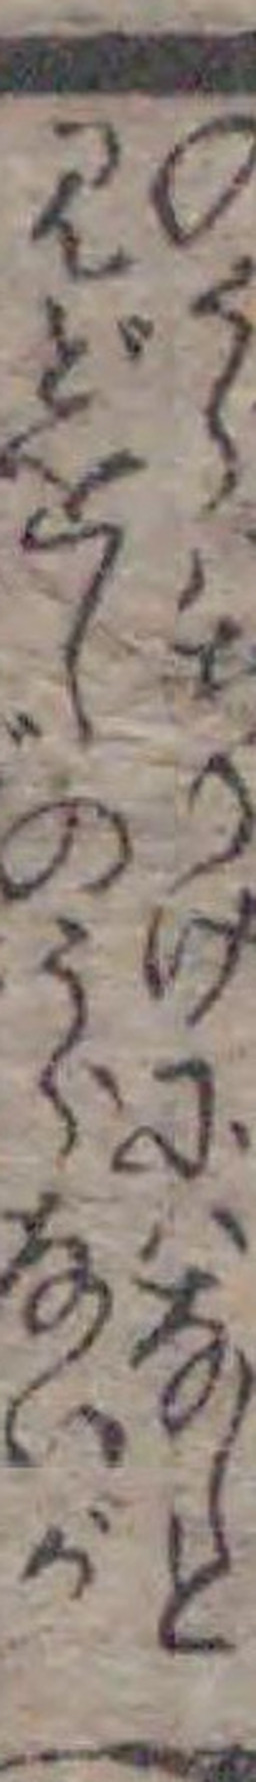見どをしのうらないが
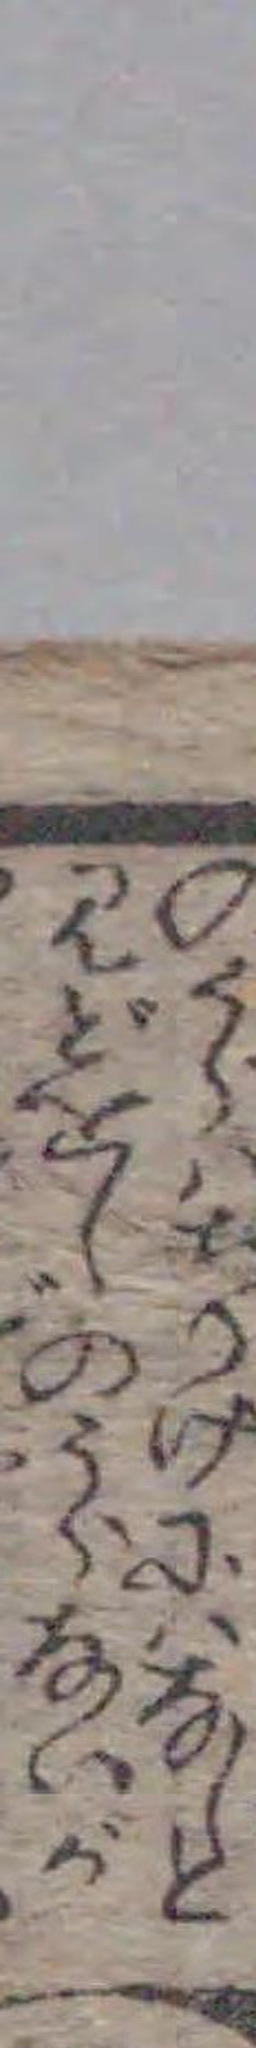見どをしのうらないが
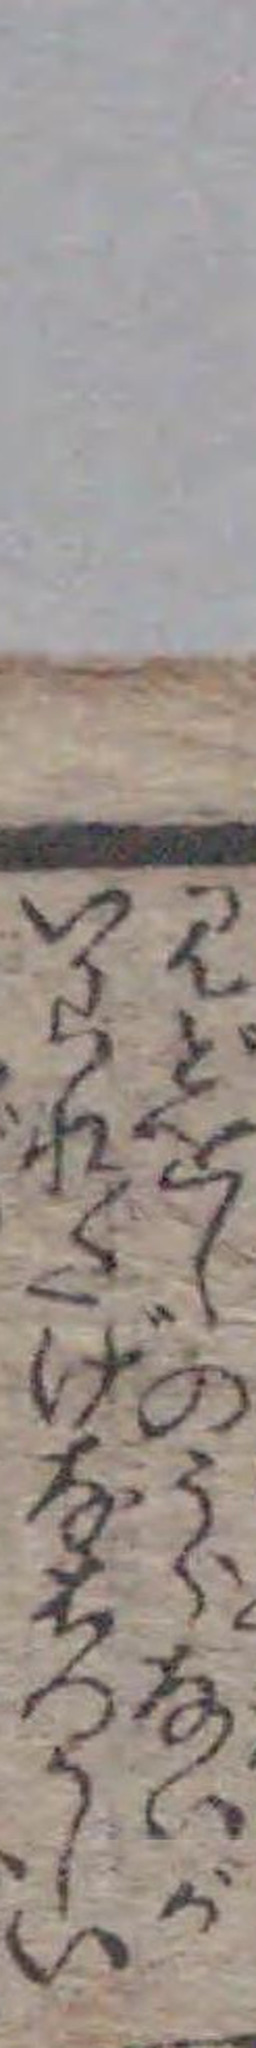いわれたげなはつかしい
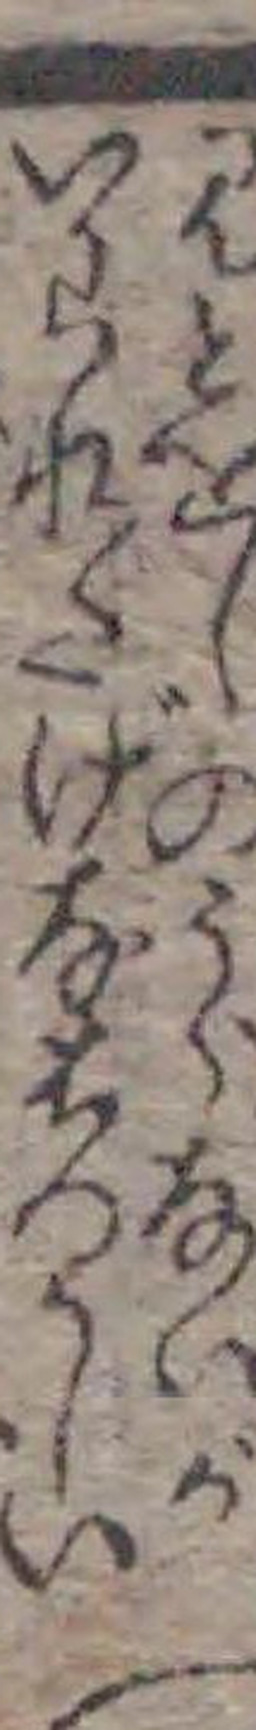いわれたげなはつかしい
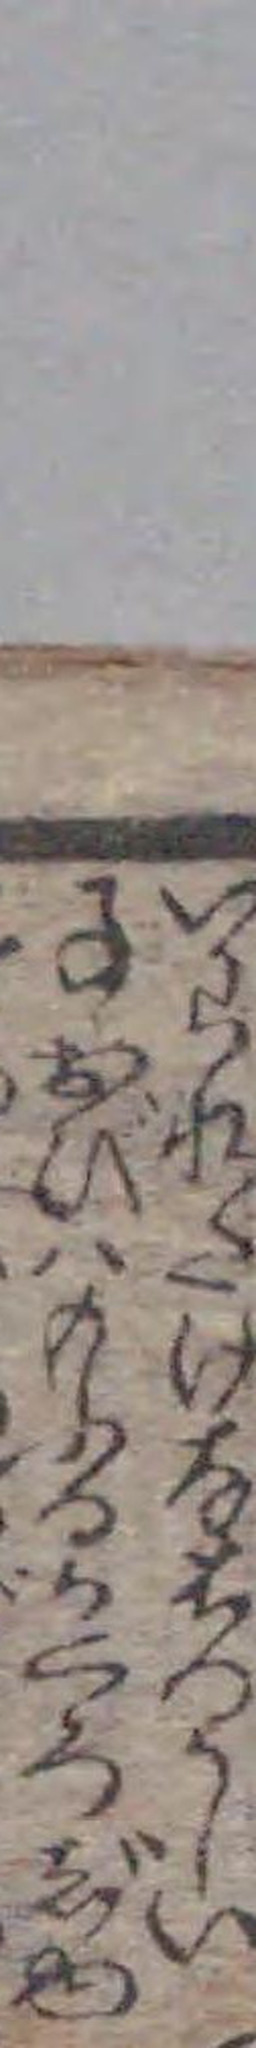事おびはもふるかくろじゆ
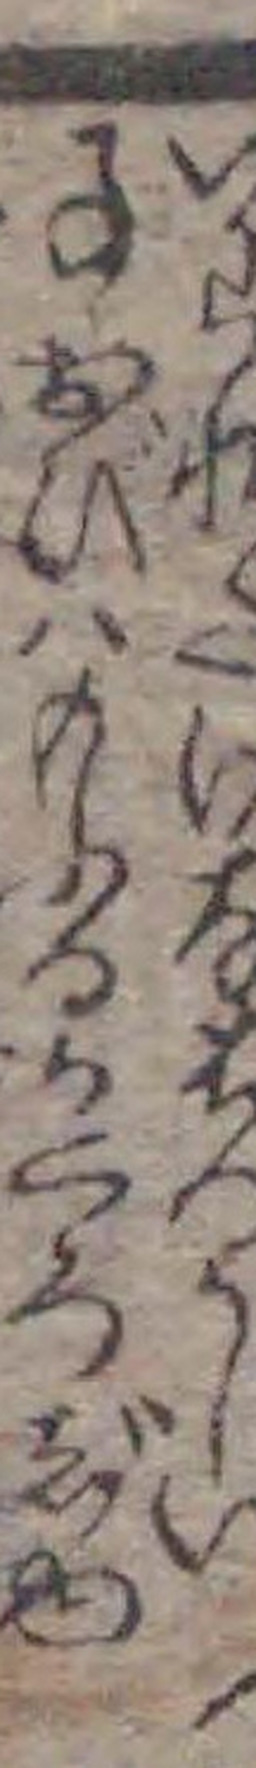事おびはもふるかくろじゆ
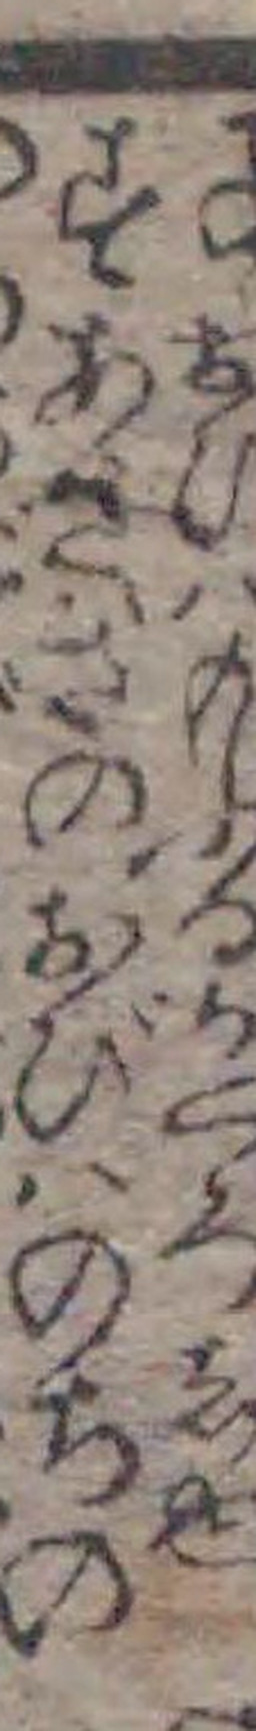すあさぎのおびはのちの
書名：神田与吉一代記 : 3巻
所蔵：国立国会図書館 National Diet Library, JAPAN
